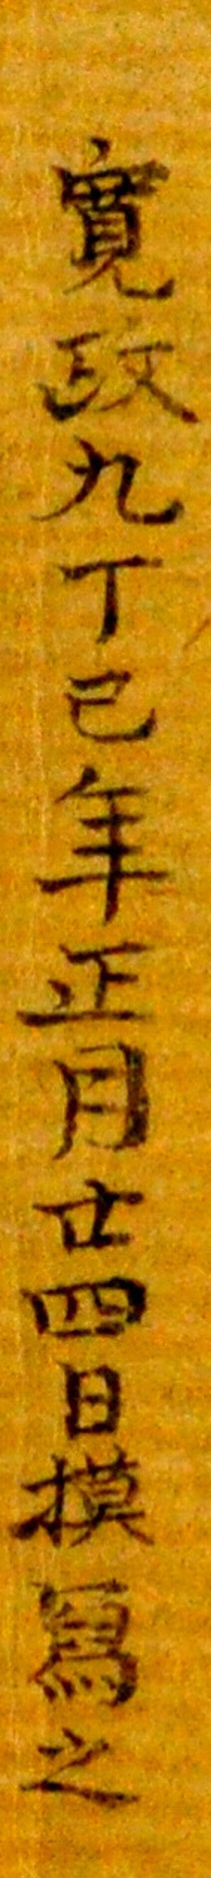寛政九丁巳年正月廿四日模写之
